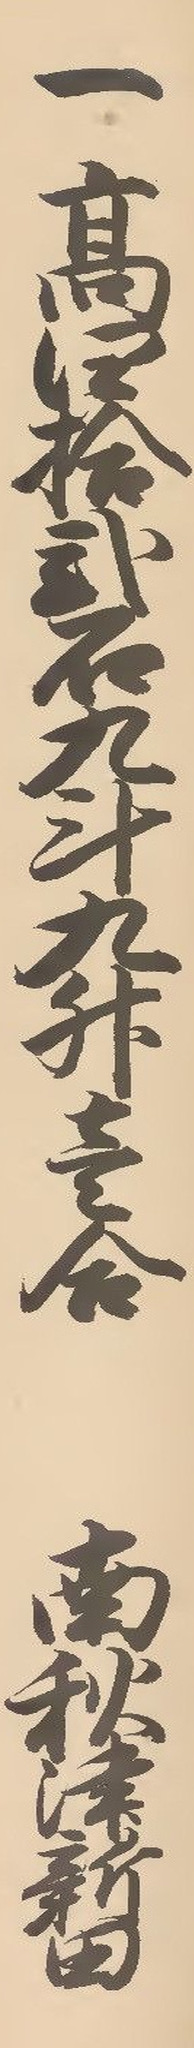一高四拾弐石九斗九升壱合南秋津新田
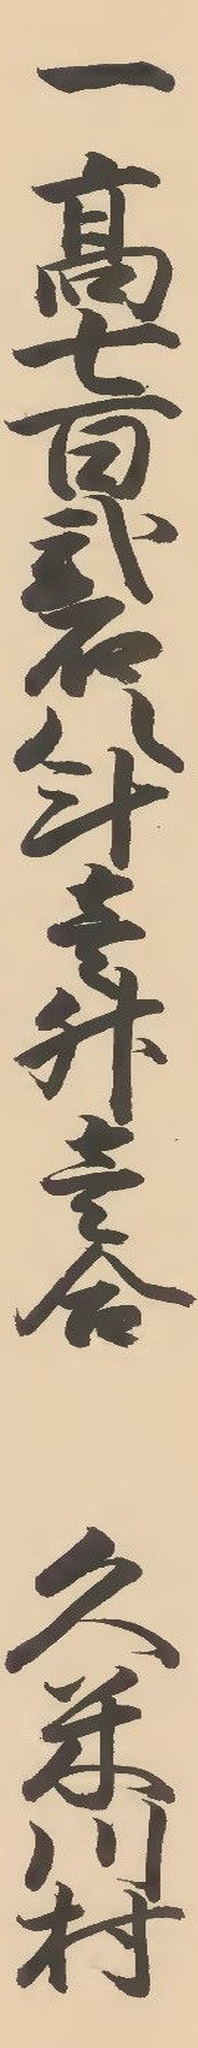一高七百弐石八斗壱升壱合久米川村
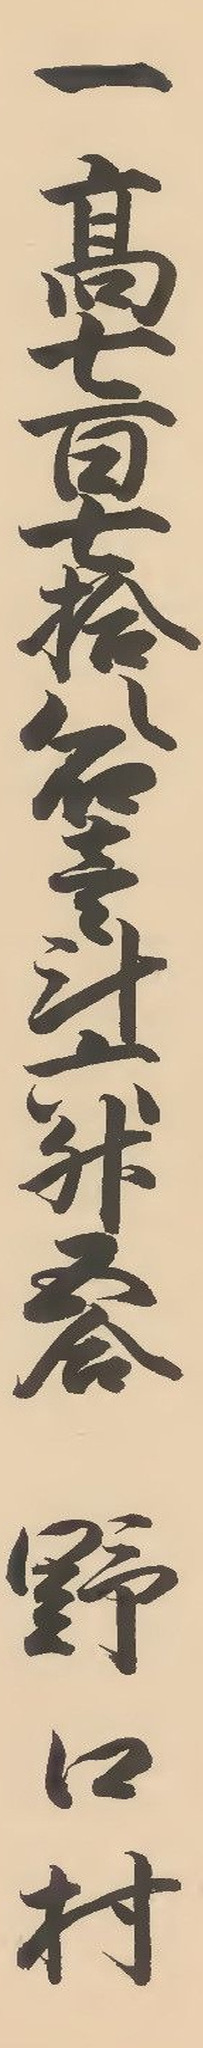一高七百七拾八石壱斗六升五合野口村
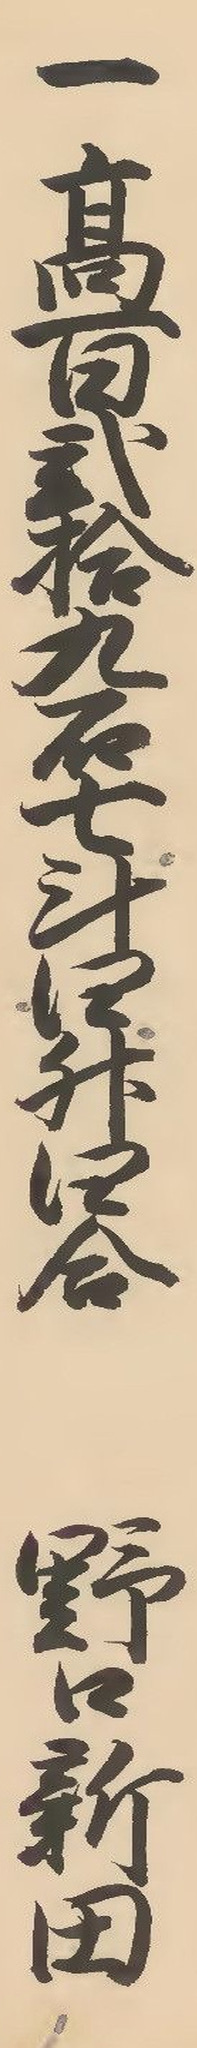一高百弐拾九石七斗四升四合野口新田

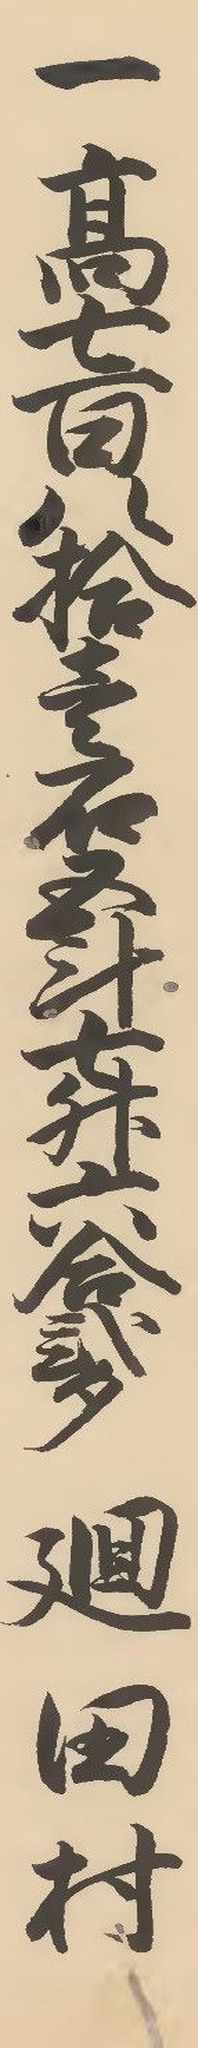一高七百八拾壱石五斗七升六合弐勺廻田村
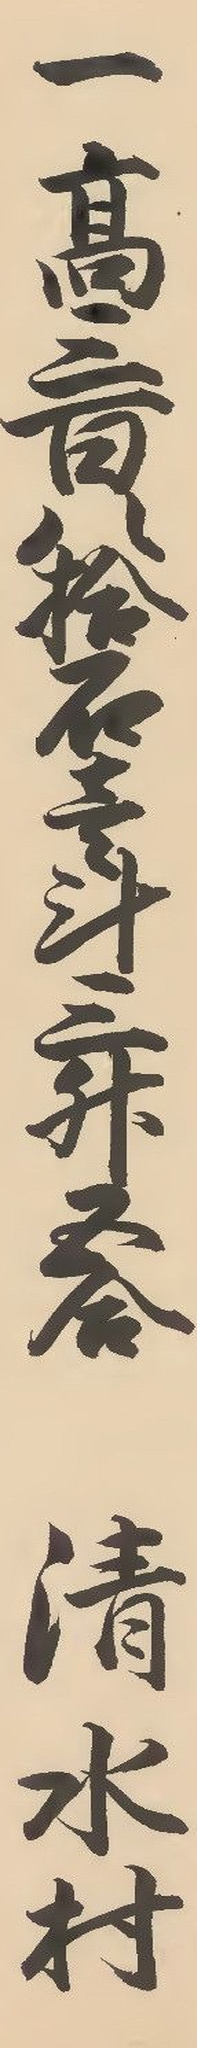一高三百八拾石壱斗三升五合清水村
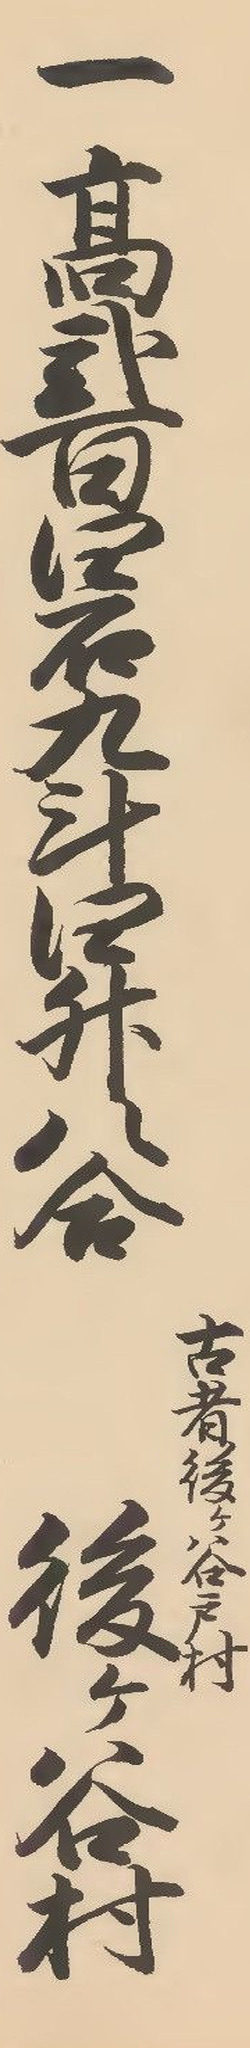一高弐百四石九斗四升八合後ヶ谷村
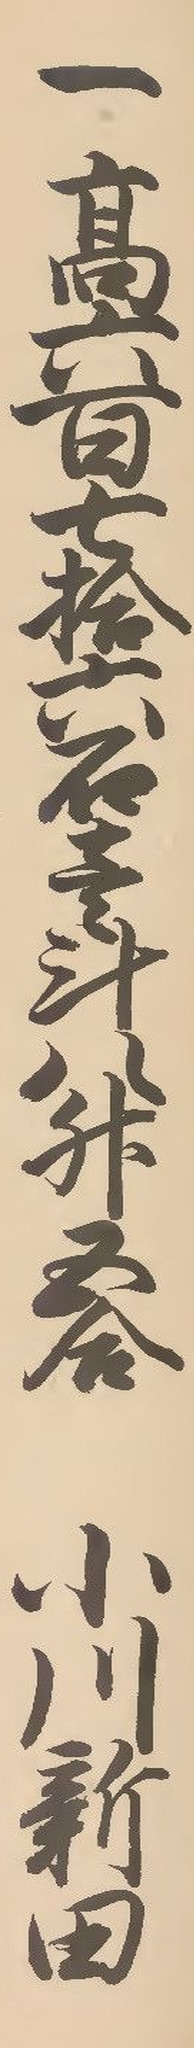一高六百七拾六石壱斗八升五合小川新田
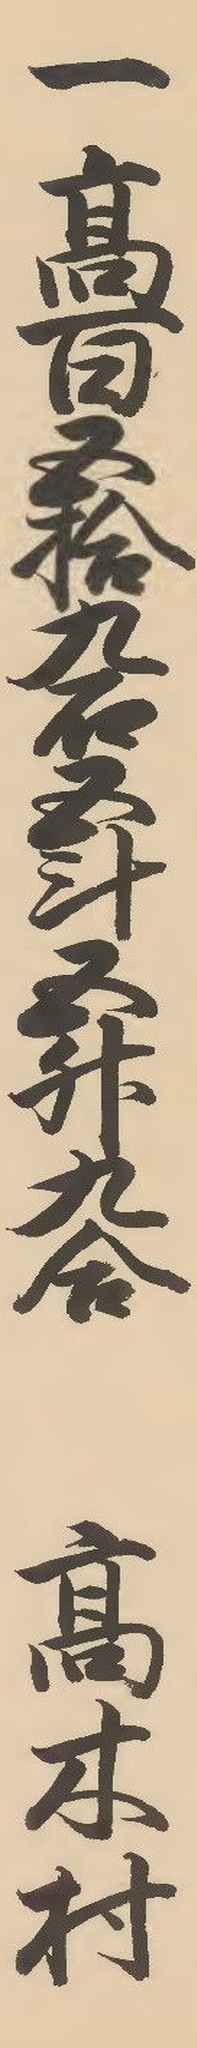一高百五拾九石五斗五升九合高木村
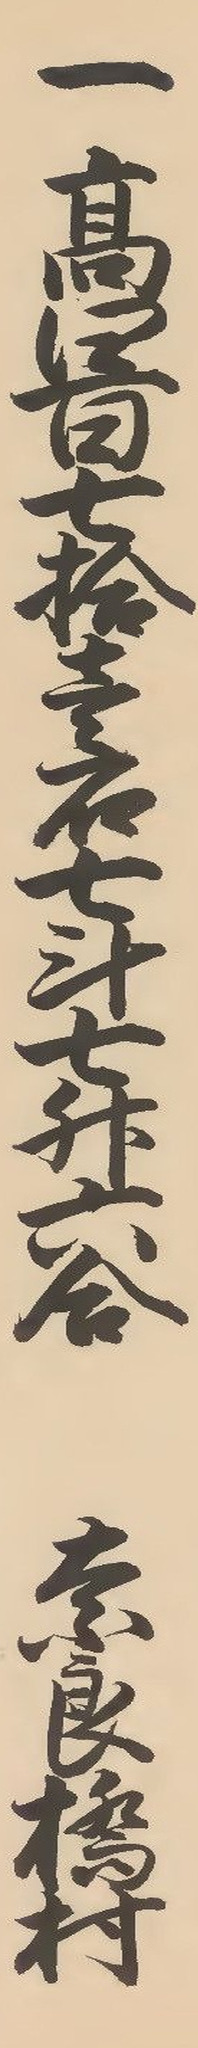一高四百七拾壱石七斗七升六合奈良橋村
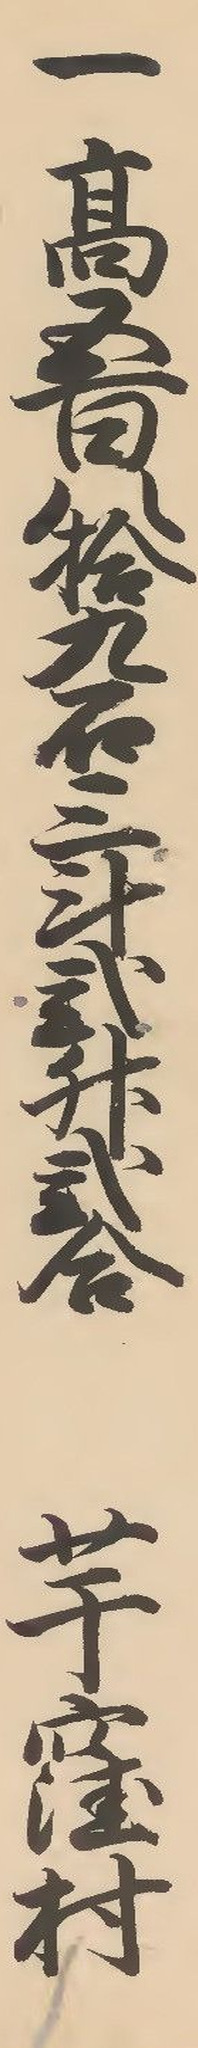一高五百八拾九石三斗弐升弐合芋窪村

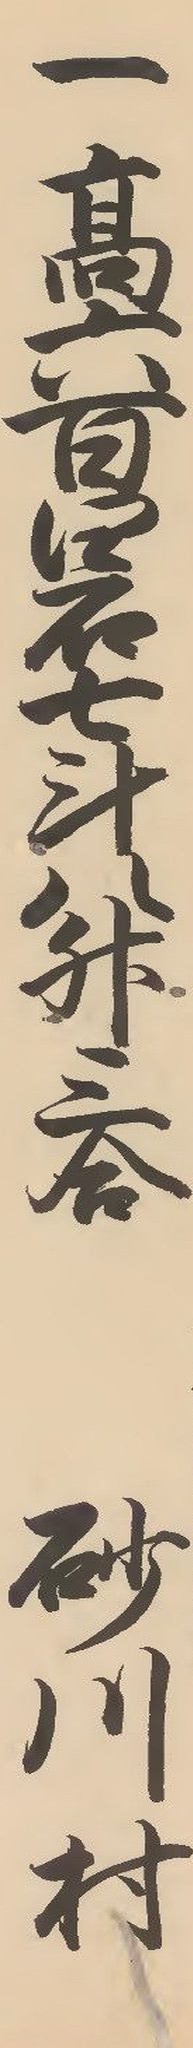一高六百四石七斗升八三合砂川村
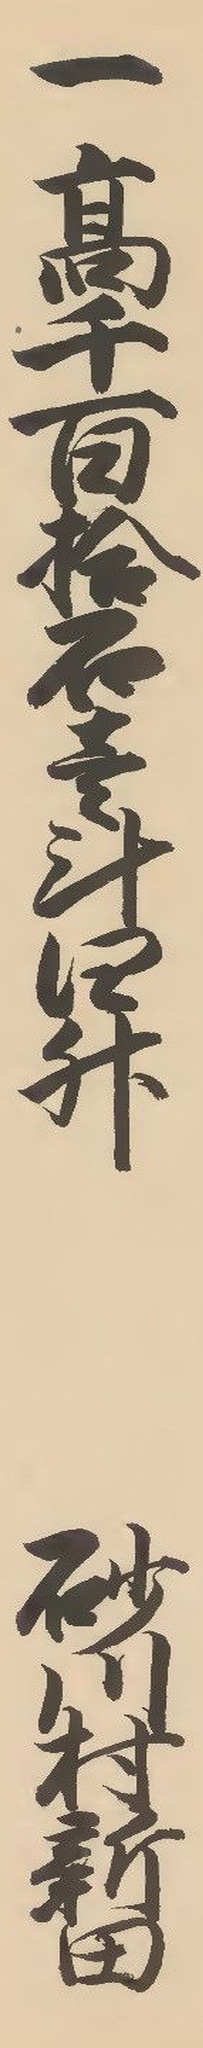一高千百拾石壱斗四升砂川村新田
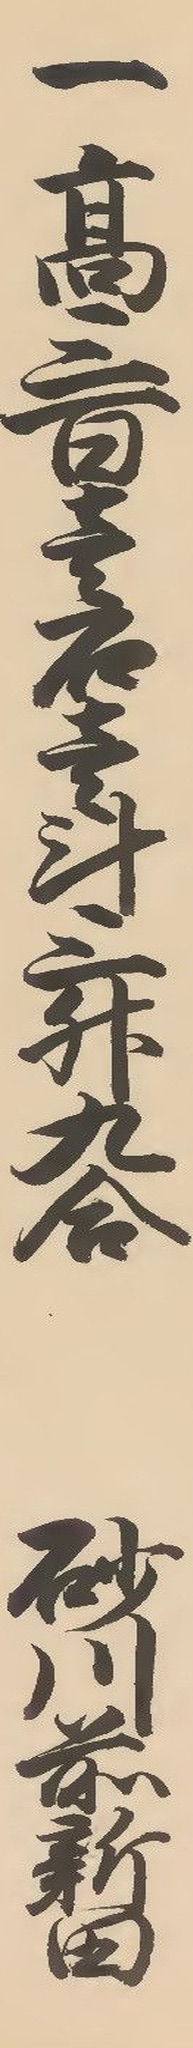一高三百壱石壱斗三升九合砂川前新田
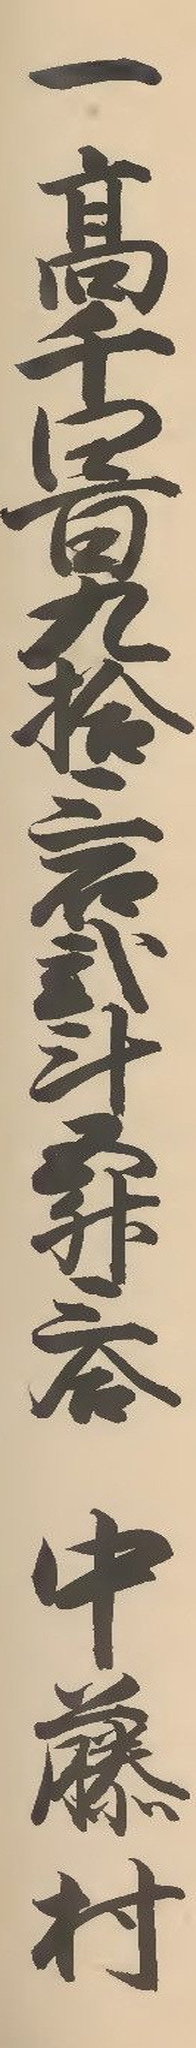一高千四百九拾三石弐斗五升三合中藤村
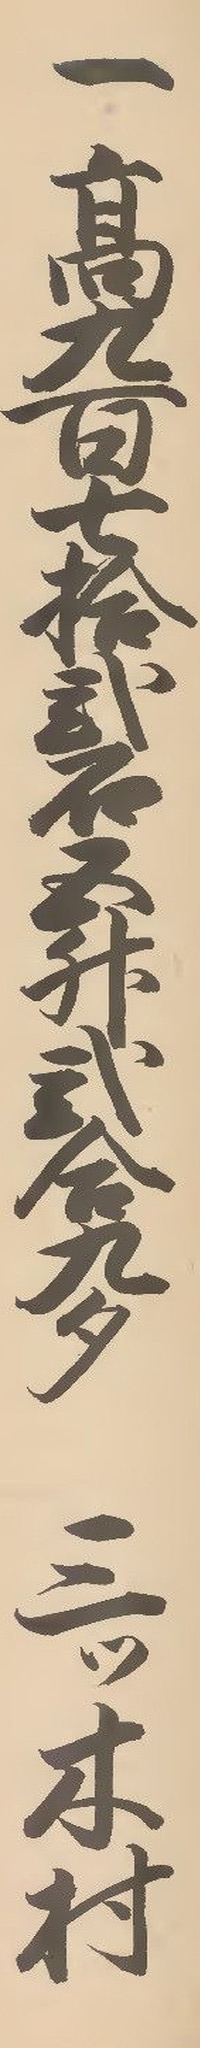一高九百七拾弐石五升弐合九勺三ッ木村
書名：武蔵国郷帳　上
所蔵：国立公文書館 National Archives of Japan
